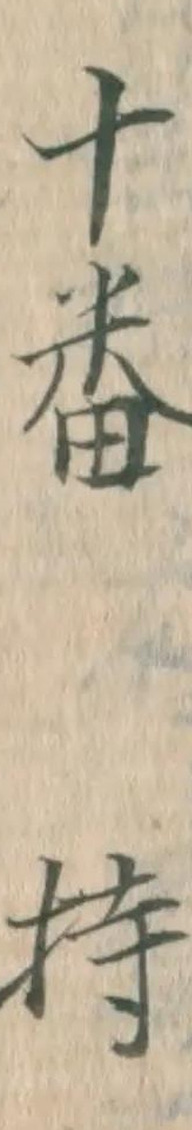十番持
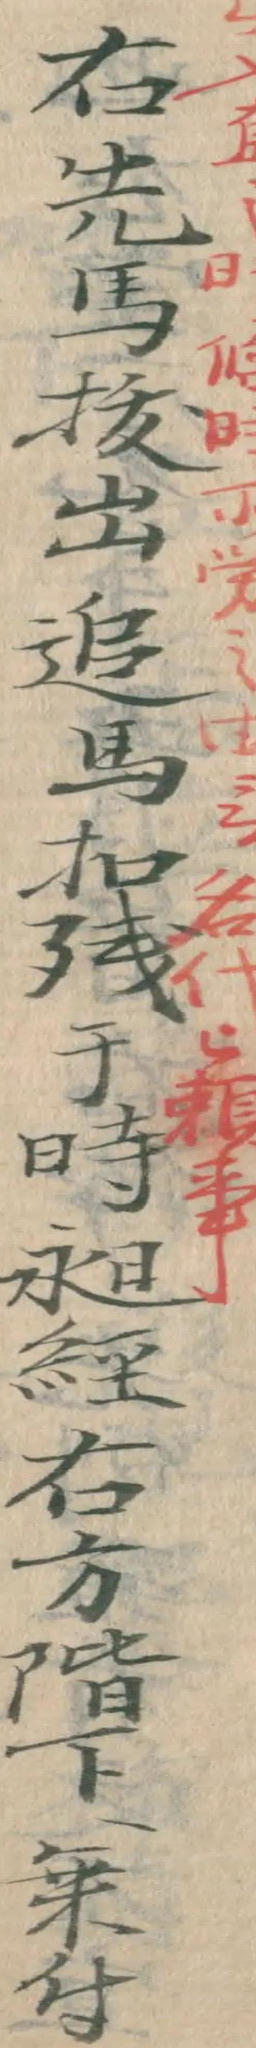右先馬抜出追馬扣残于時昶経右方階下へ乗付
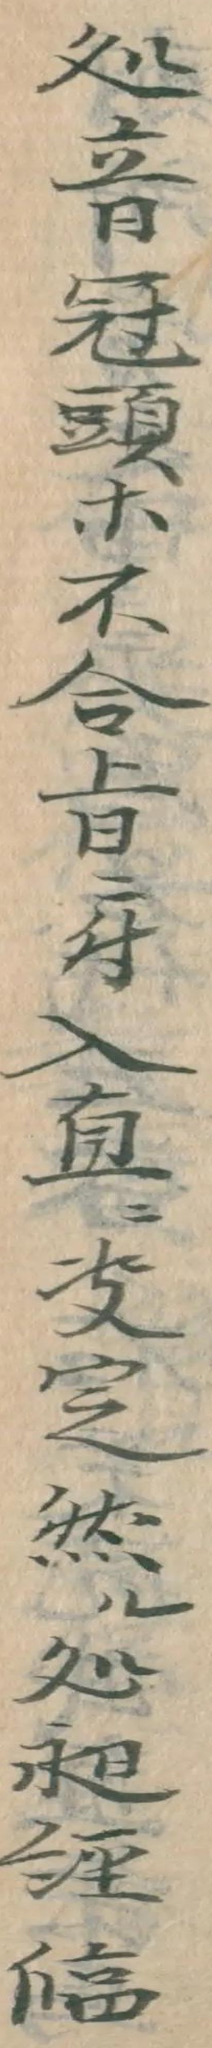処音冠頭等不合旨ニ付入直ニ決定然ル処昶経臨

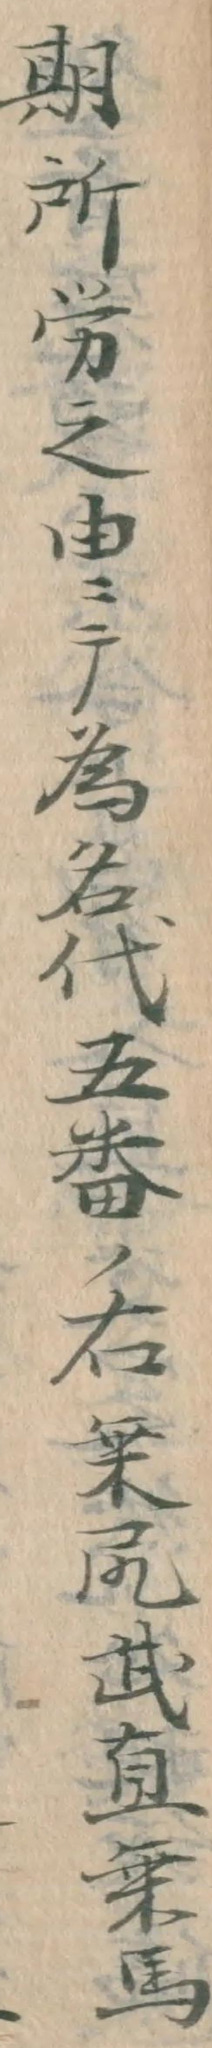期所労之由ニテ為名代五番ノ右乗尻武直乗馬
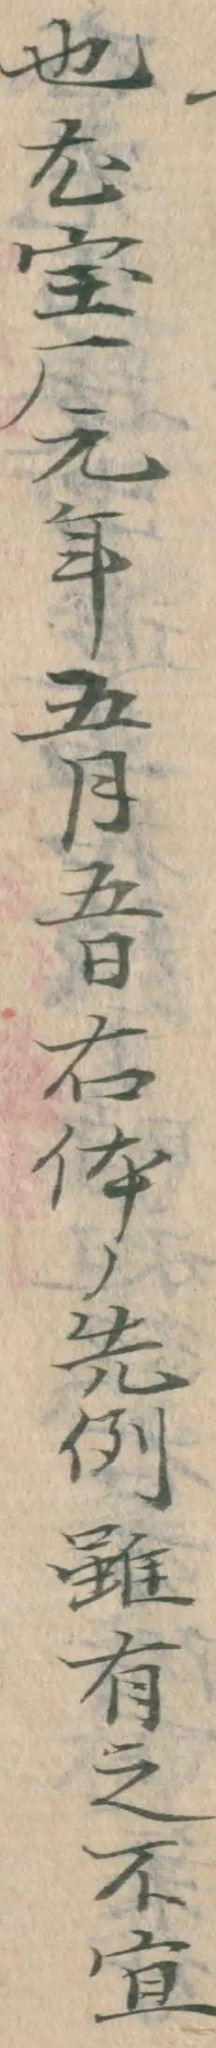也尤宝暦元年五月五日右体ノ先例雖有之不宜
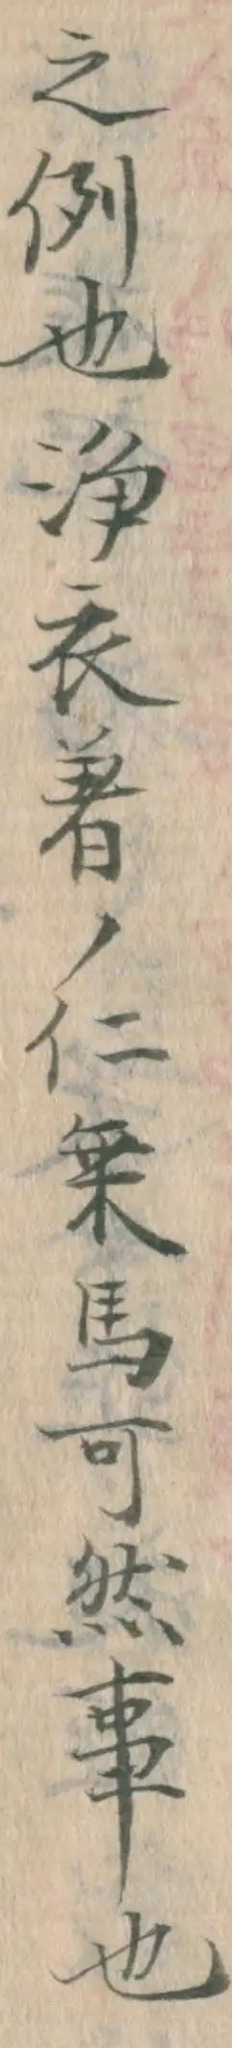之例也浄衣着ノ仁乗馬可然事也
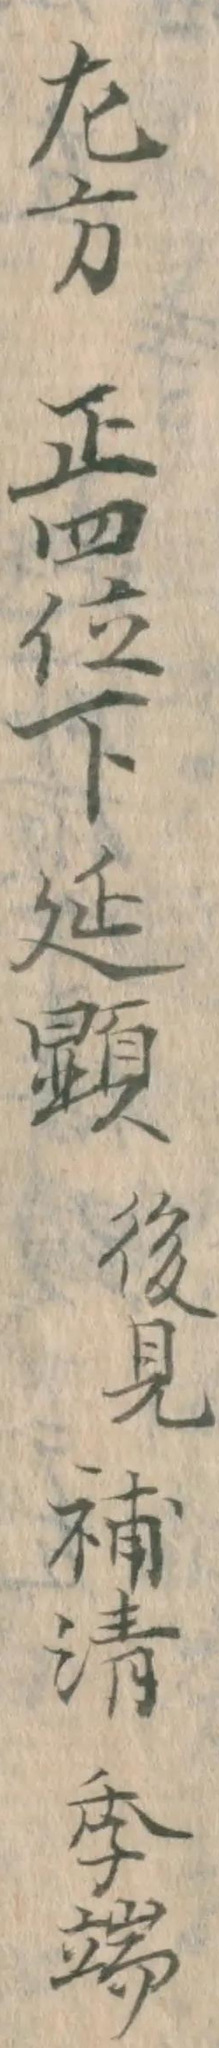左方正四位下延顕後見補清季端
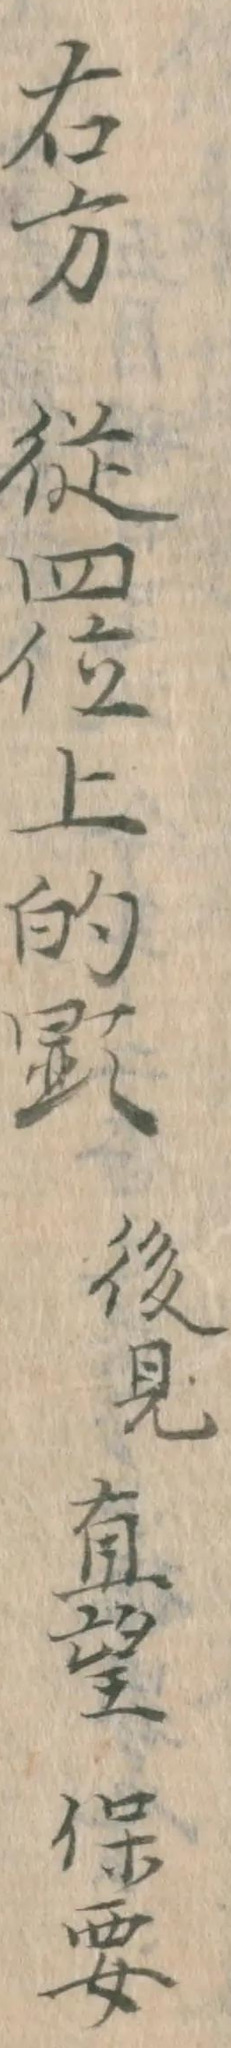右方従四位上的顕後見直望保要
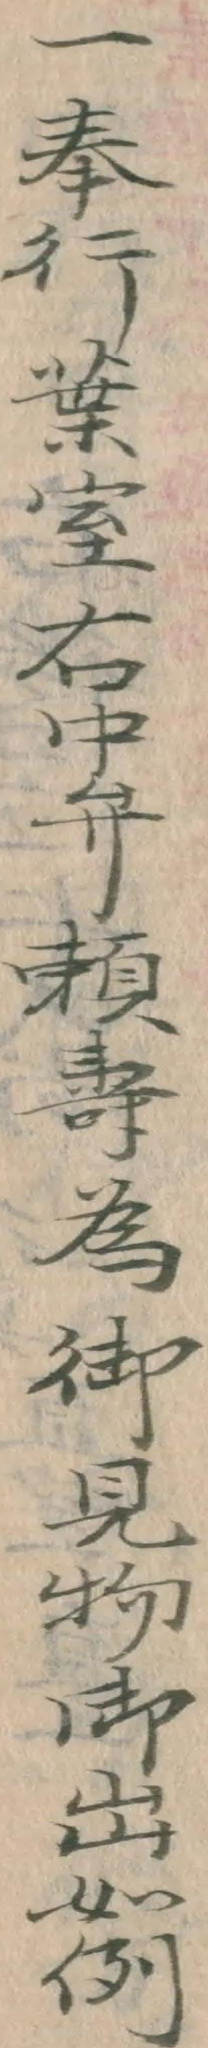一奉行葉室右中弁頼寿為御見物御出如例
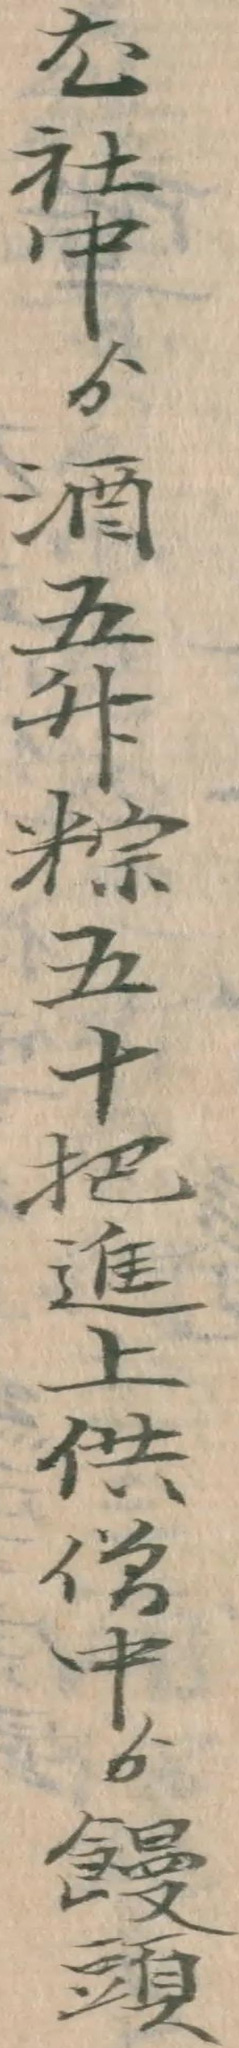尤社中ゟ酒五升粽五十把進上供僧中ゟ饅頭
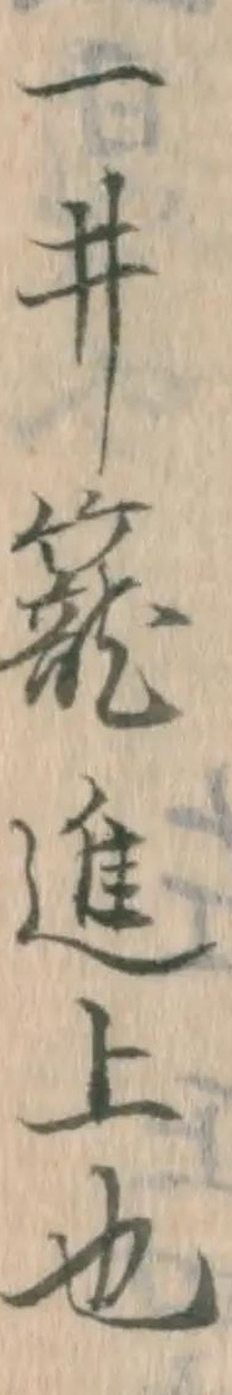一井籠進上也
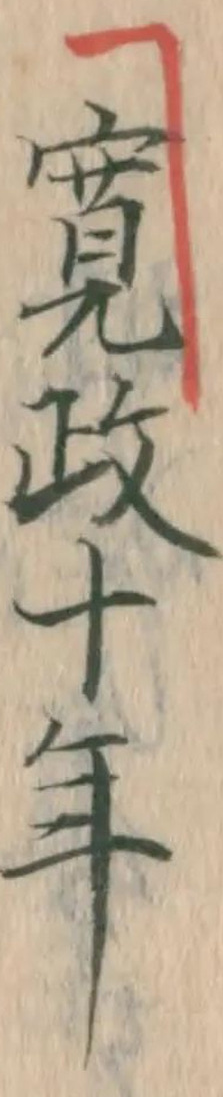寛政十年
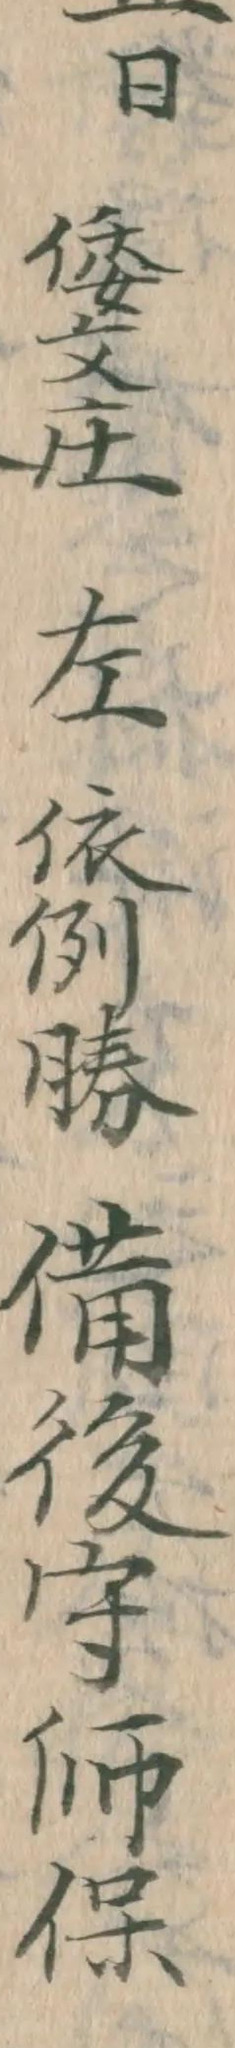倭文庄左依例勝備後守師保
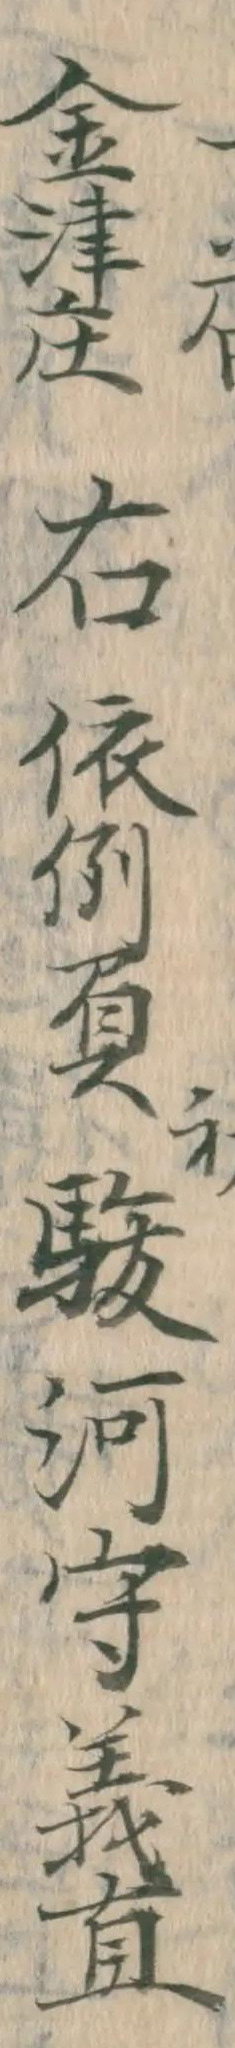金津庄右依例負駿河守義直
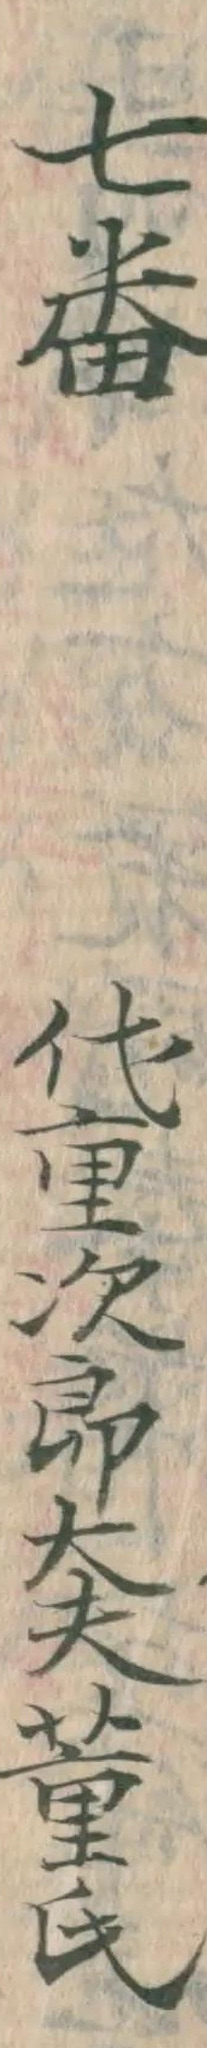七番代重次郎大夫菫氏
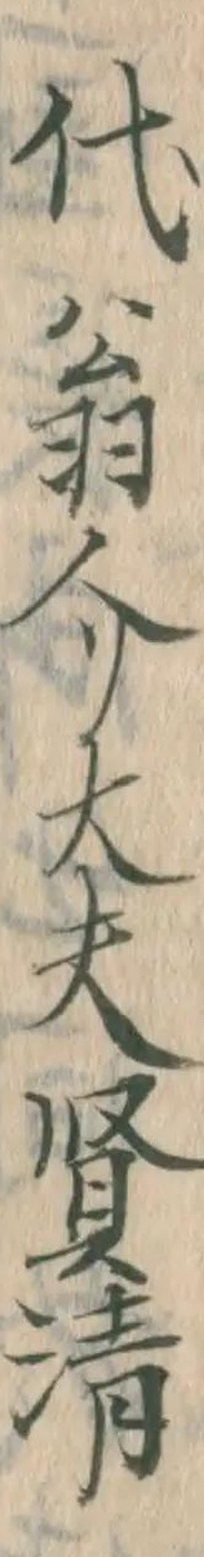代翁介大夫賢清
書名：賀茂社記録. 第10冊
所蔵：国立国会図書館 National Diet Library, JAPAN
